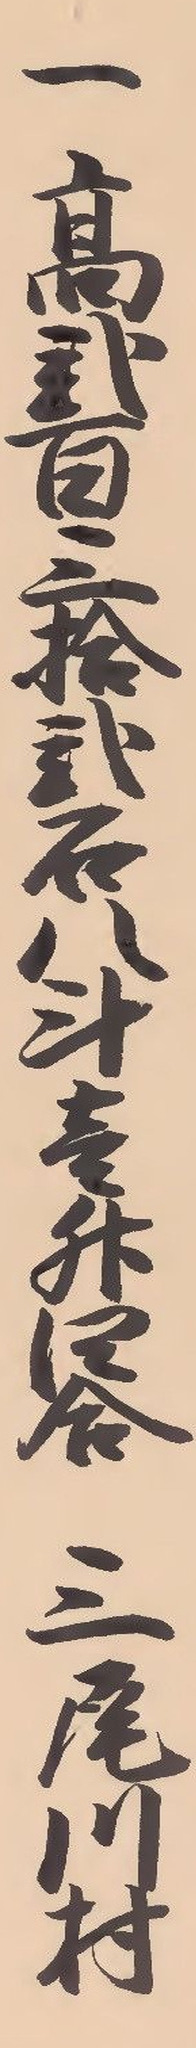一高弐百三拾弐石八斗壱升四合三尾川村
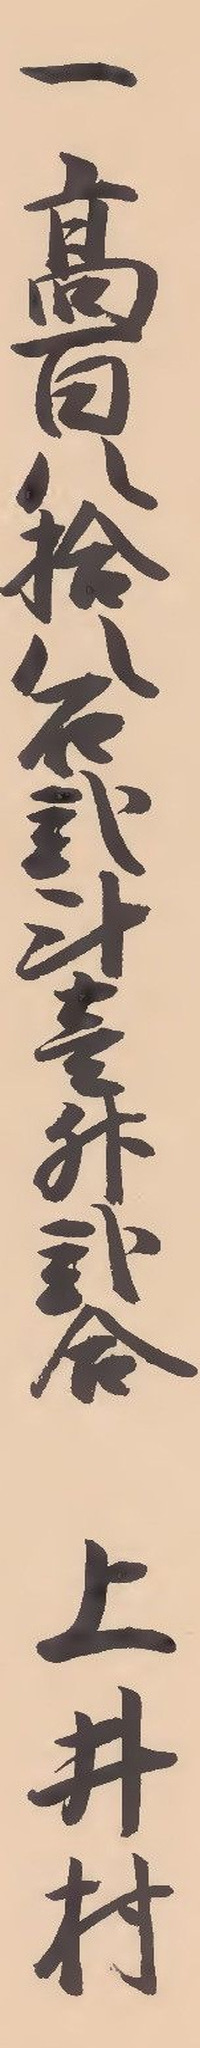一高百八拾八石弐斗壱升弐合上井村
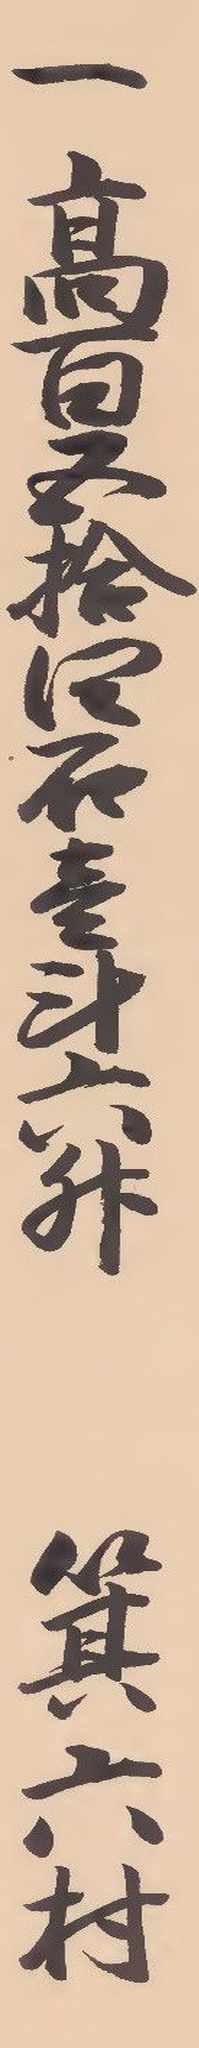一高百五拾四石壱斗六升箕六村
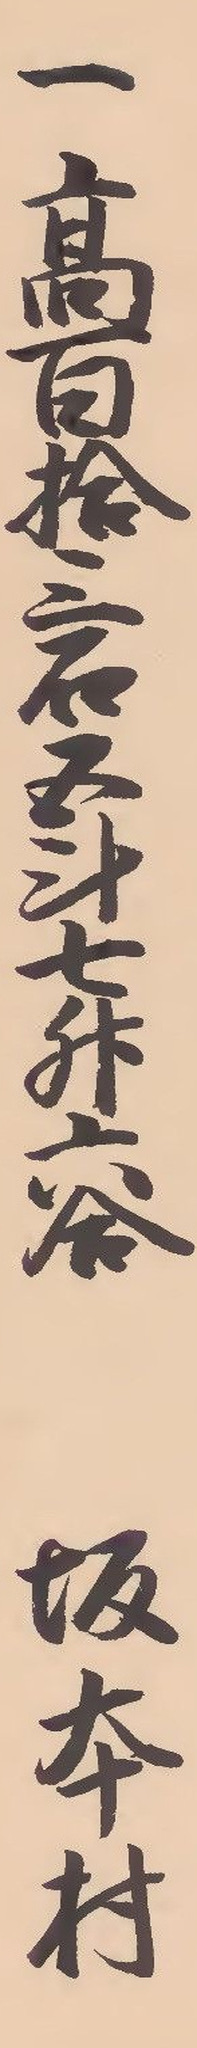一高百拾三石五斗七升六合坂本村

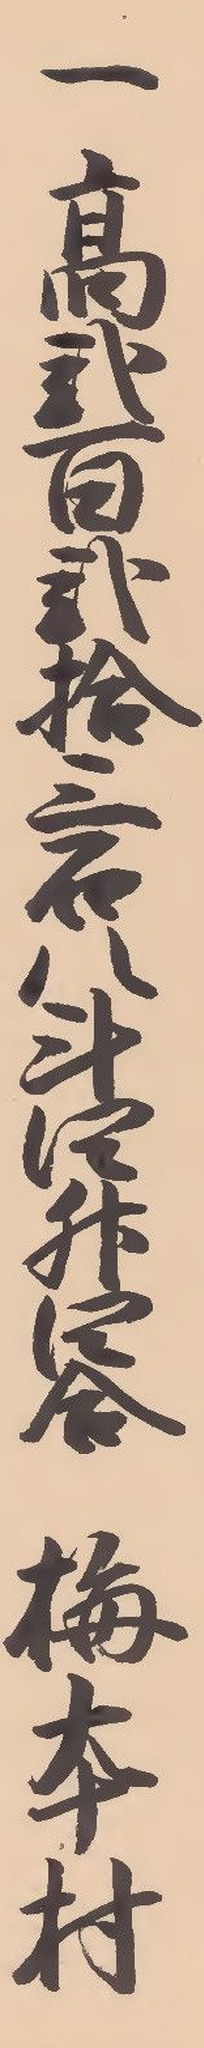一高弐百弐拾三石八斗四升四合梅本村
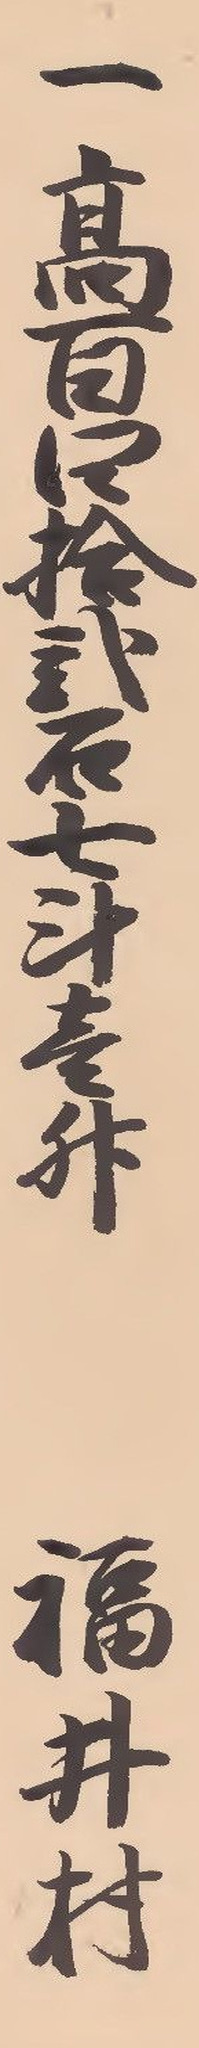一高百四拾弐石七斗壱升福井村
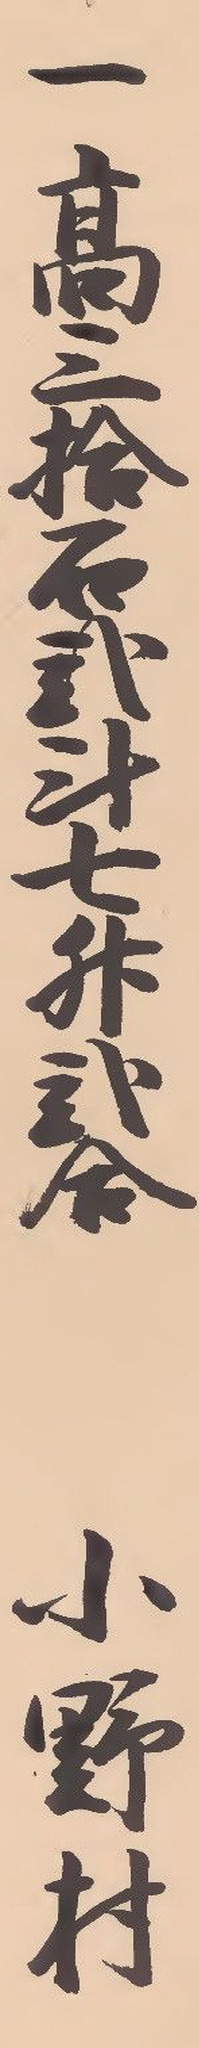一高三拾石弐斗七升弐合小野村
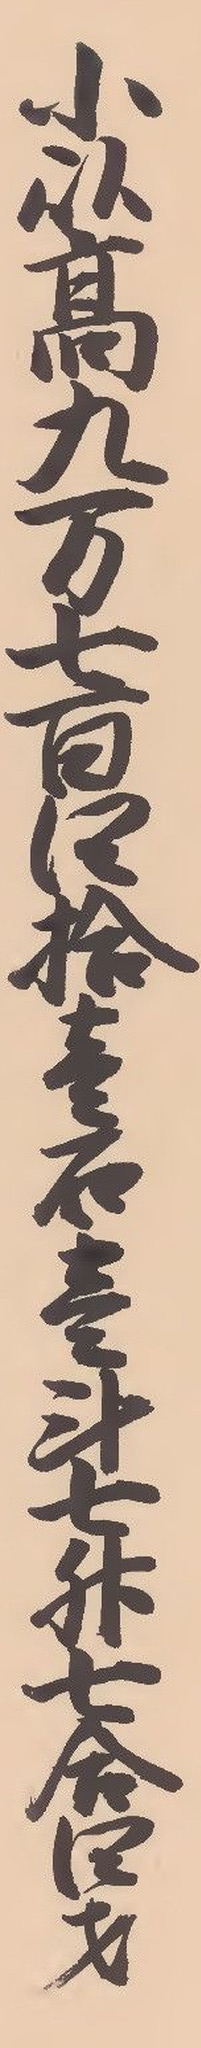小以高九万七百四拾壱石壱斗七升七合四才

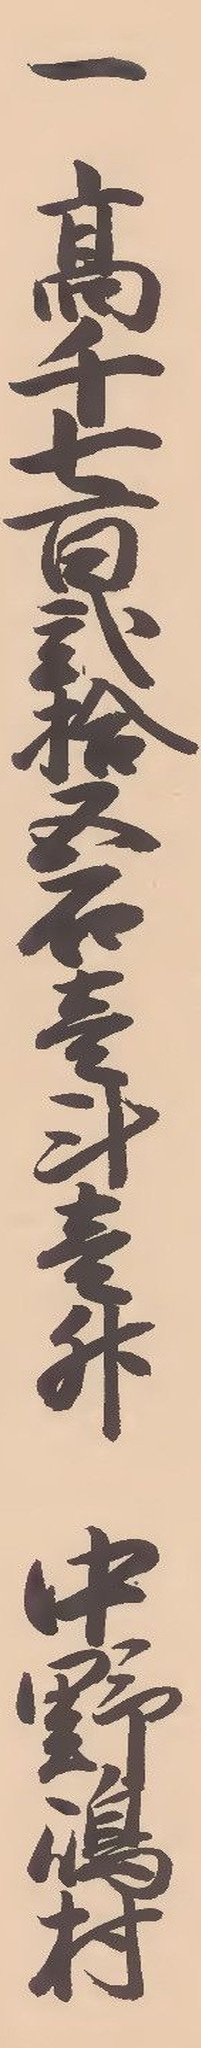一高千七百弐拾五石壱斗壱升中野島村
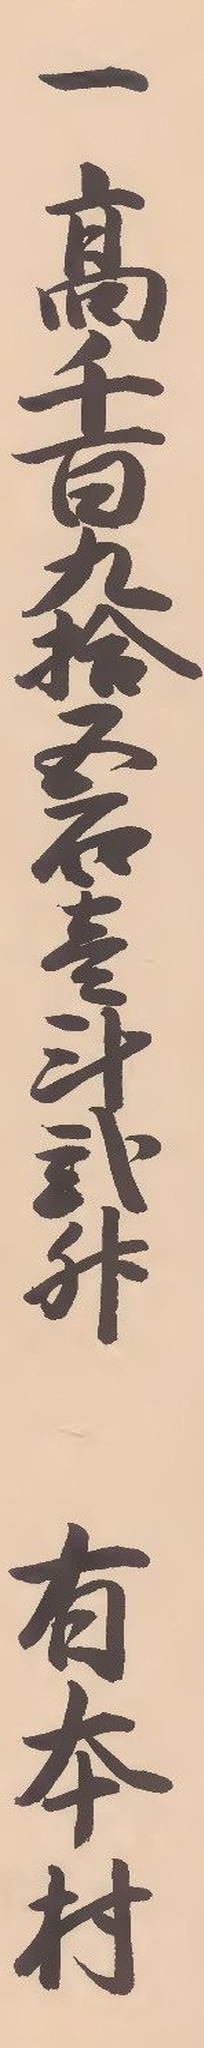一高千百九拾五石壱斗弐升有本村
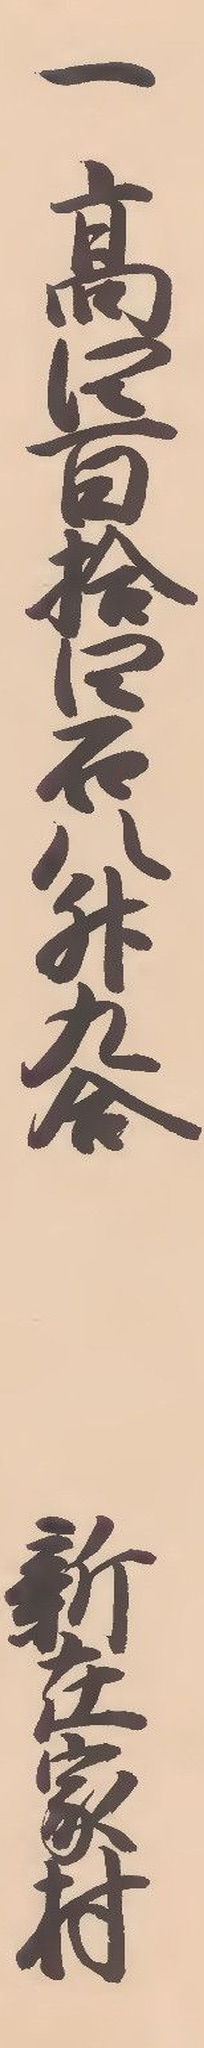一高四百拾四石八升九合新在家村
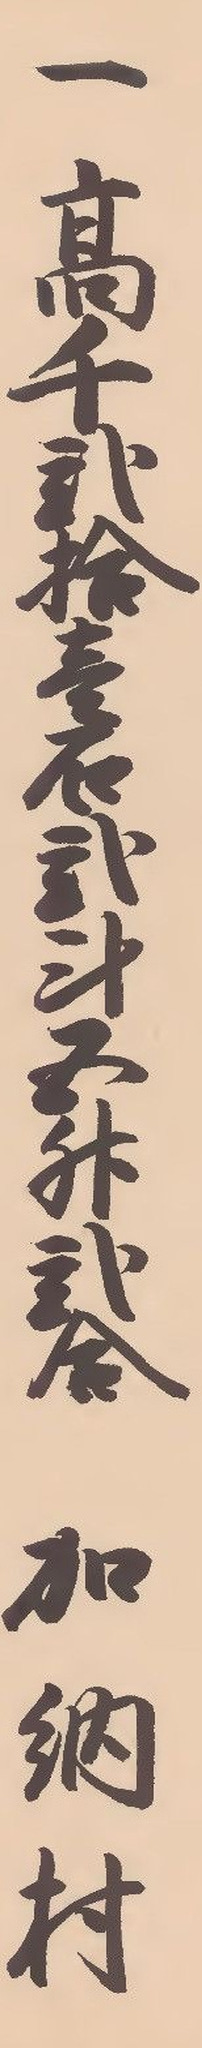一高千弐拾壱石弐斗五升弐合加納村

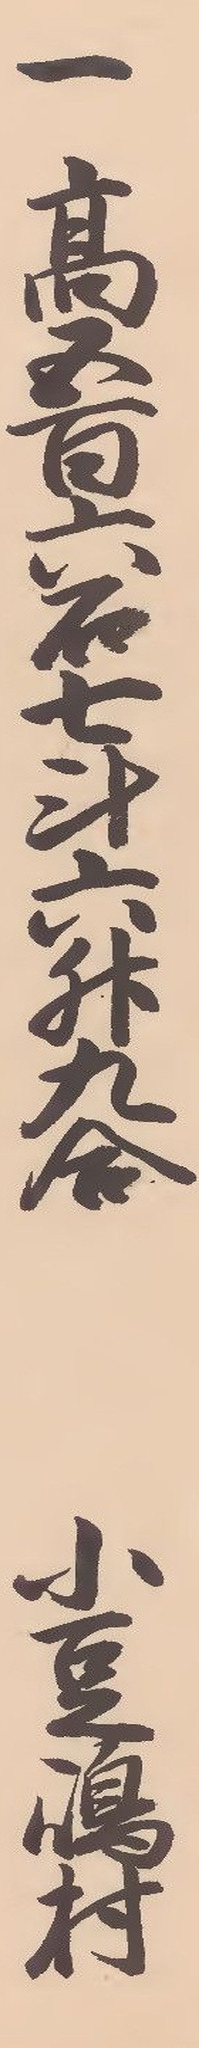一高五百六石七斗六升九合小豆島村
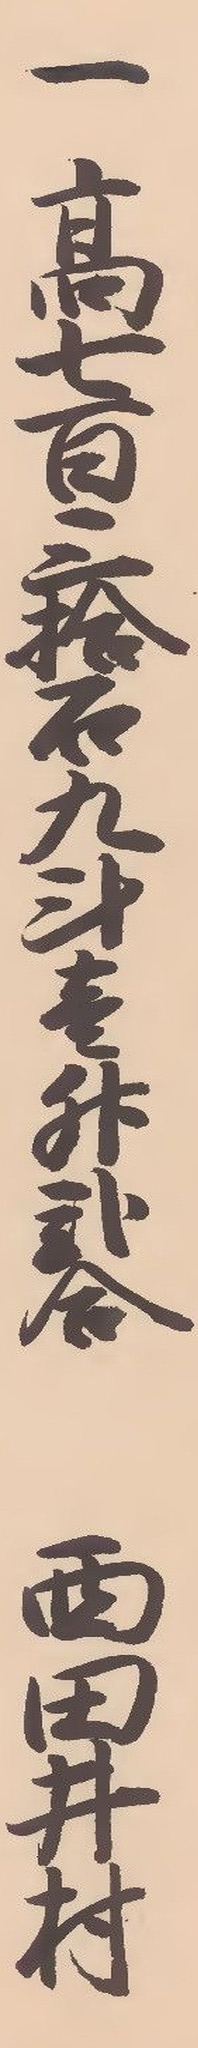一高七百三拾石九斗壱升弐合西田井村
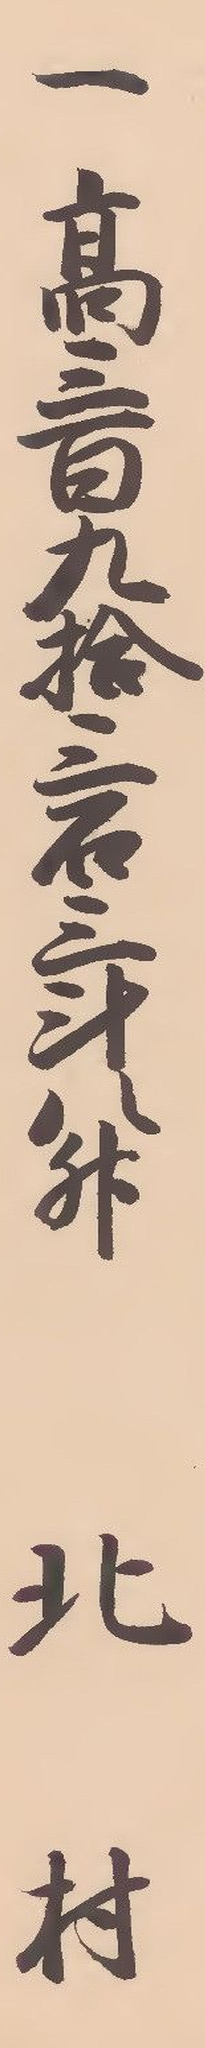一高三百九拾三石三斗八升北村
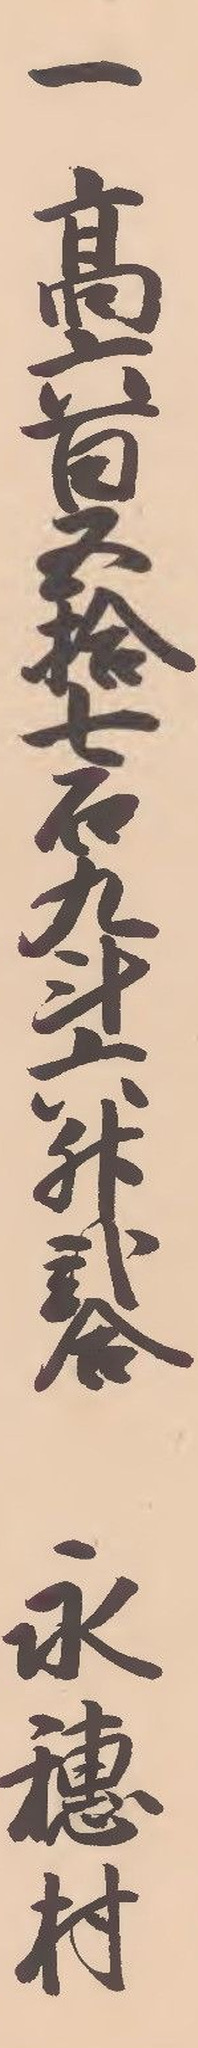一高六百五拾七石九斗六升弐合永穂村
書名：紀伊国郷帳
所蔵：国立公文書館 National Archives of Japan
